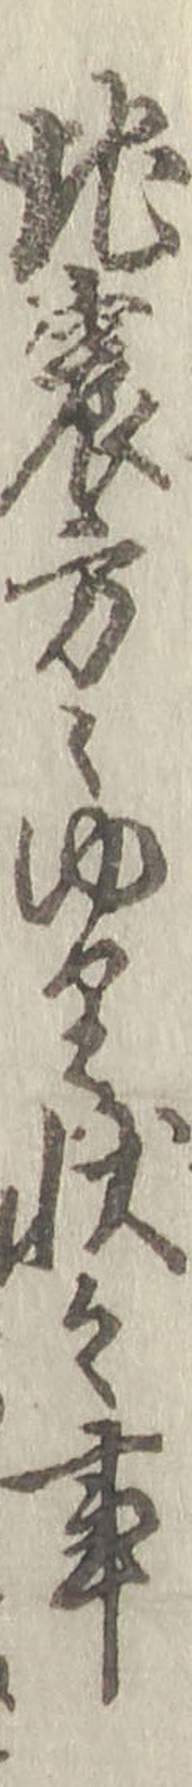地震方〻ゆり状之事
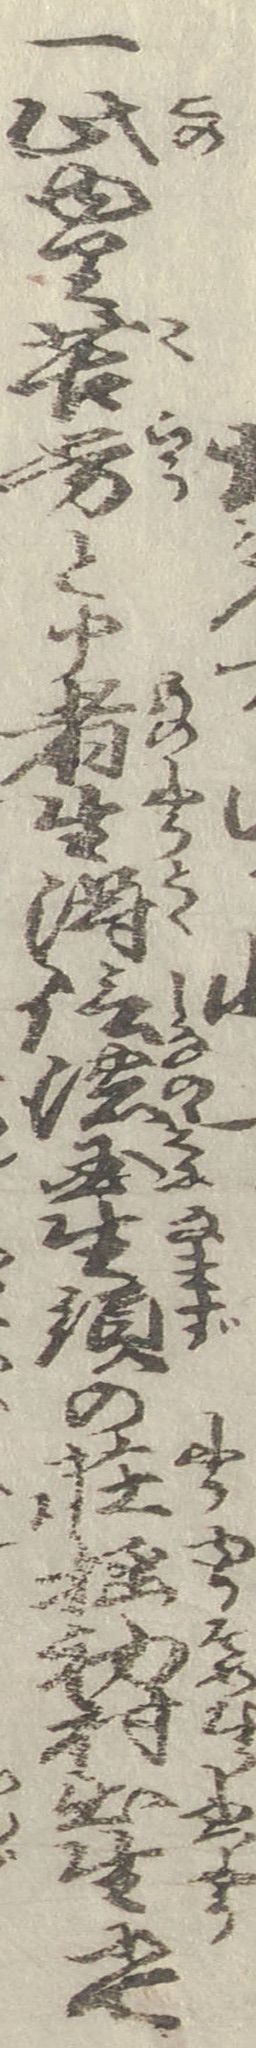一此ゆり苦労と申者生得信濃国生須の荘揺初村出生にて
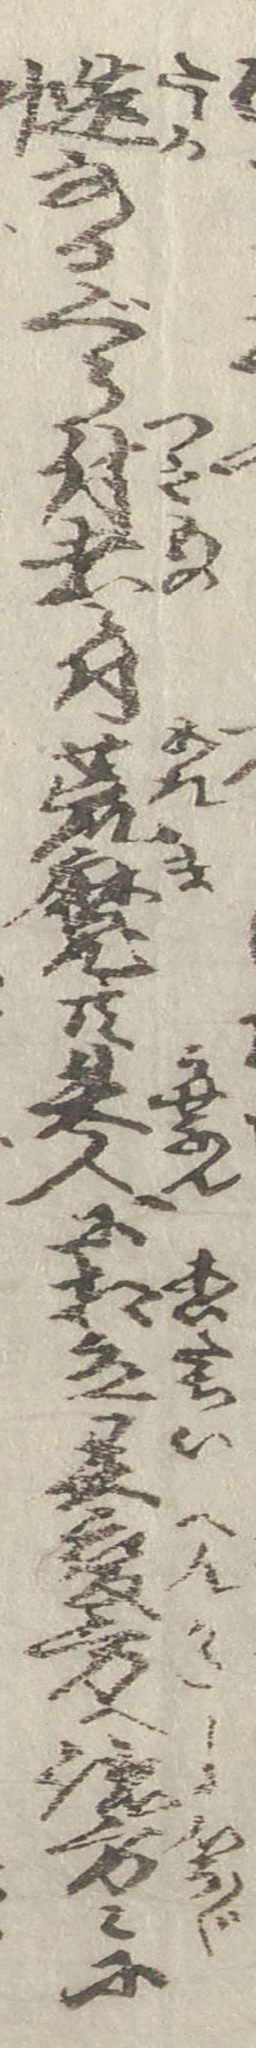慥なるぐら付者ニ付荒魔共失人に相立異変方へ諸方〻に
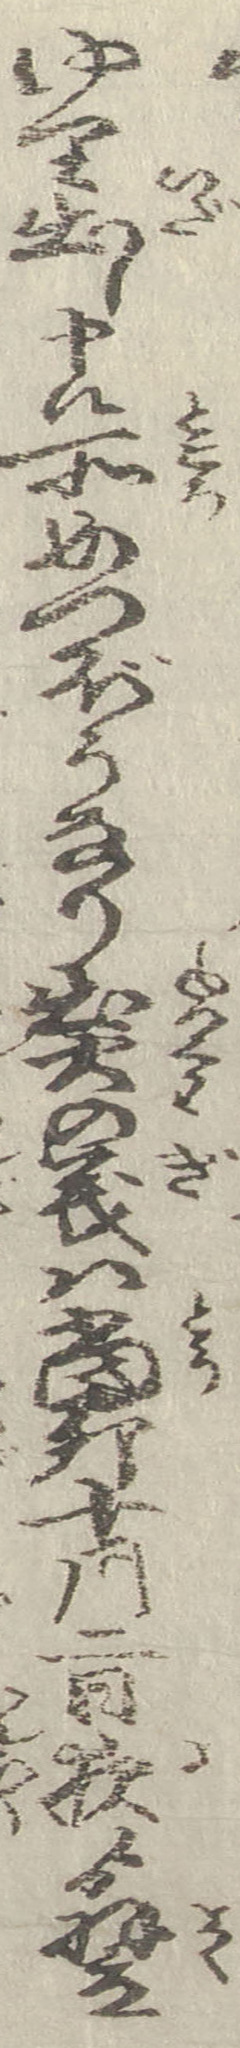ゆり出し申候所めつぼうなり出火の義ハ當夘十月二日夜ゟ翌
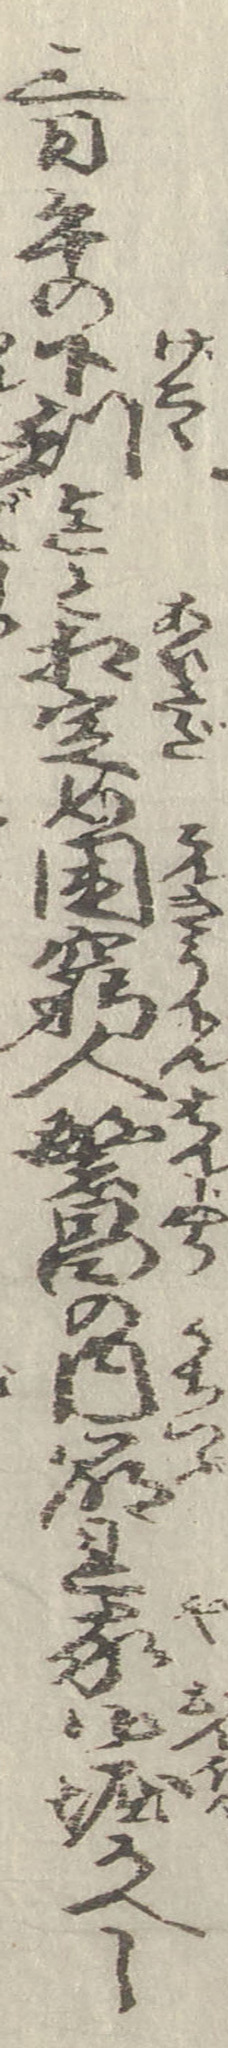三日午の下刻迄と相定め困窮人繁昌の内崩れ家御掘かへし
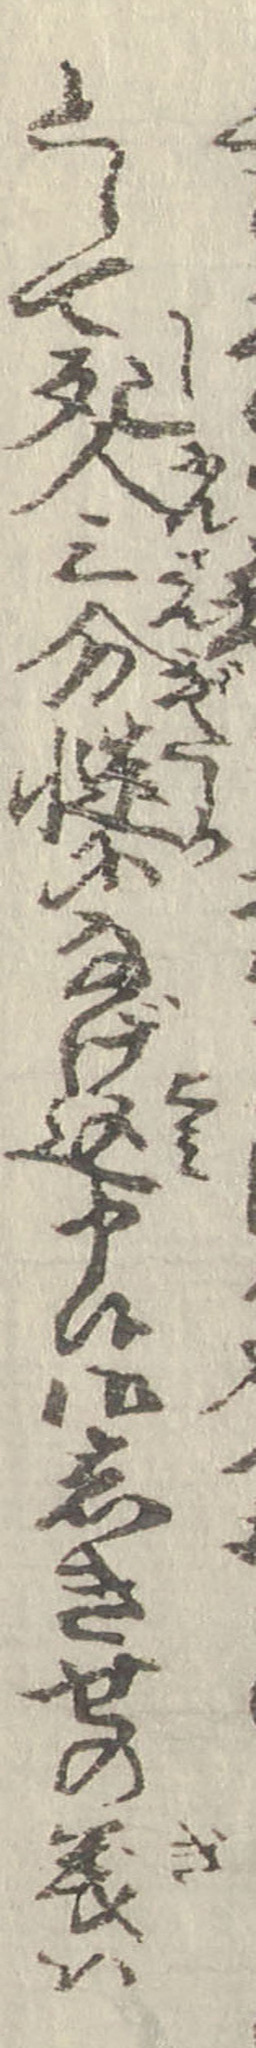として死人三分慥になげ込申候御しきせの義ハ
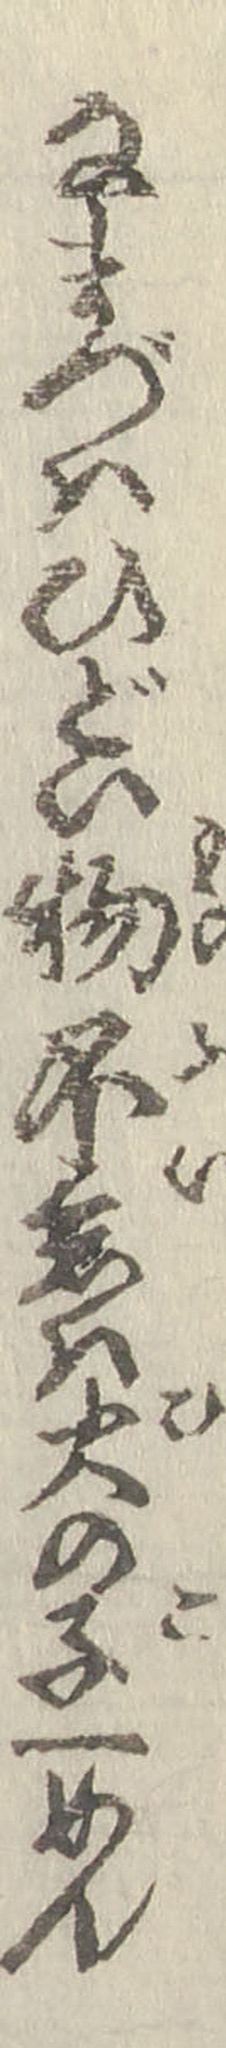なまづハひどい物不意ハ火の子一めん
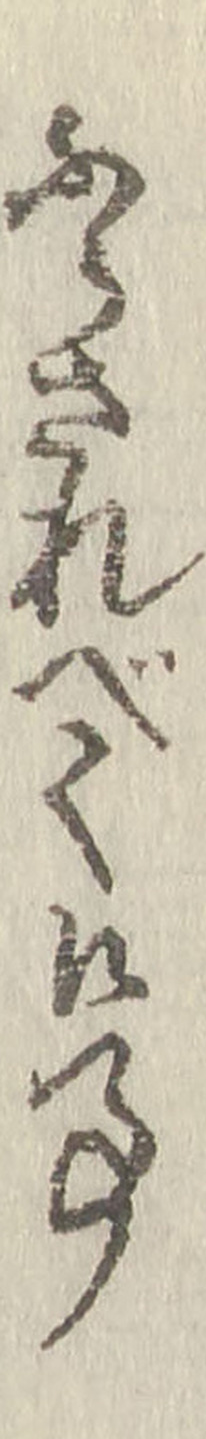ふらされべく候事
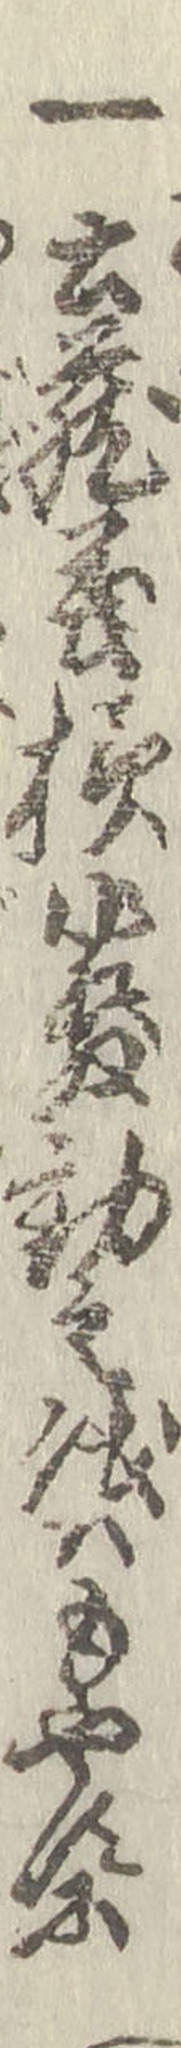一土蔵義様御發動之儀ハもやすに
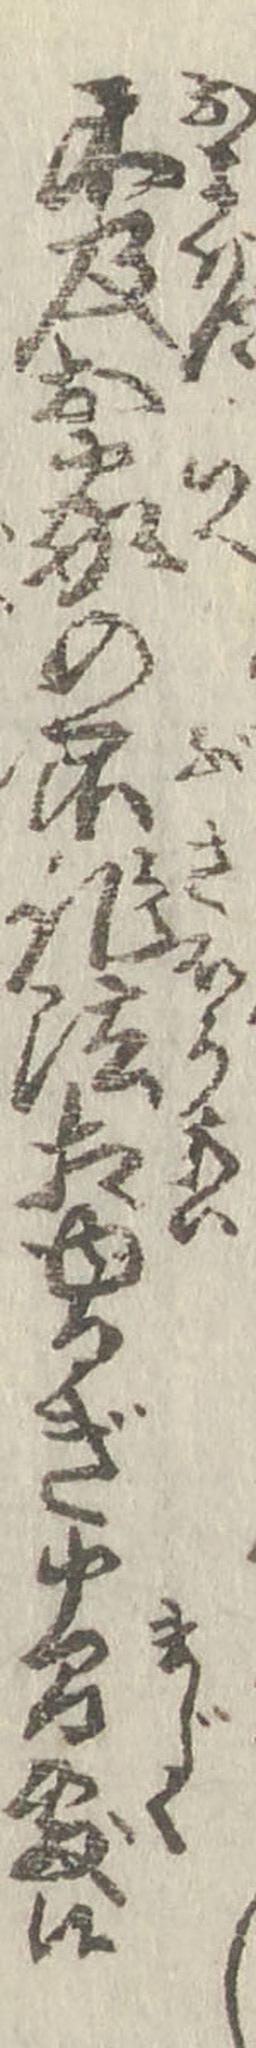不及お家の不作法相ゆるぎ申間敷候
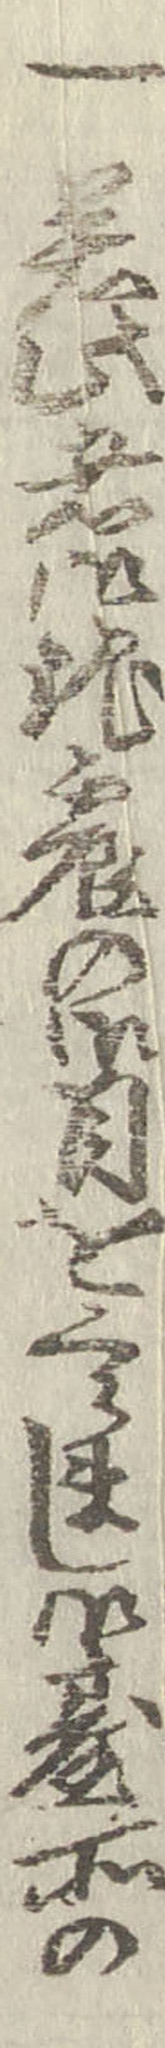一若此者地震の御目をくらまし御臺所の
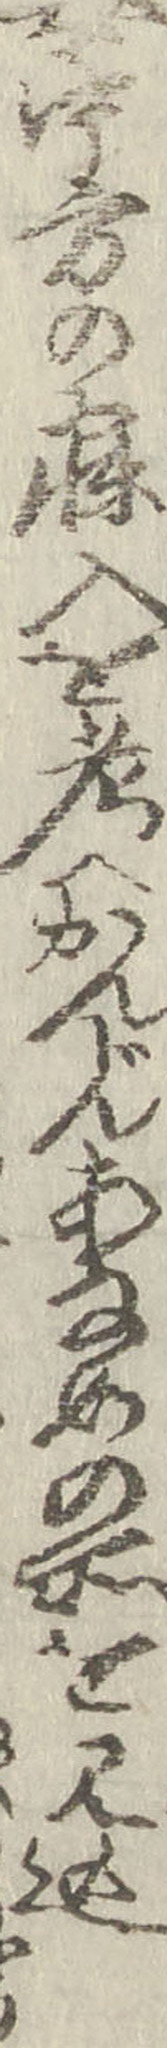女中方の寐入を考へかんじんあなめの所を見込
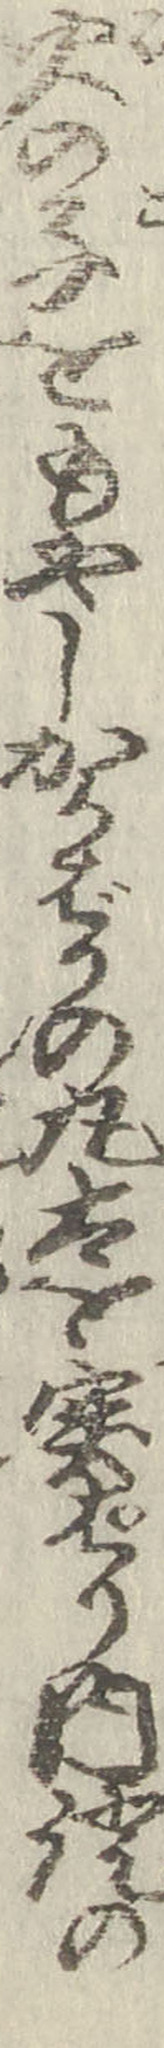火の子をもやしかりばりの丸太を突ぱり内證の
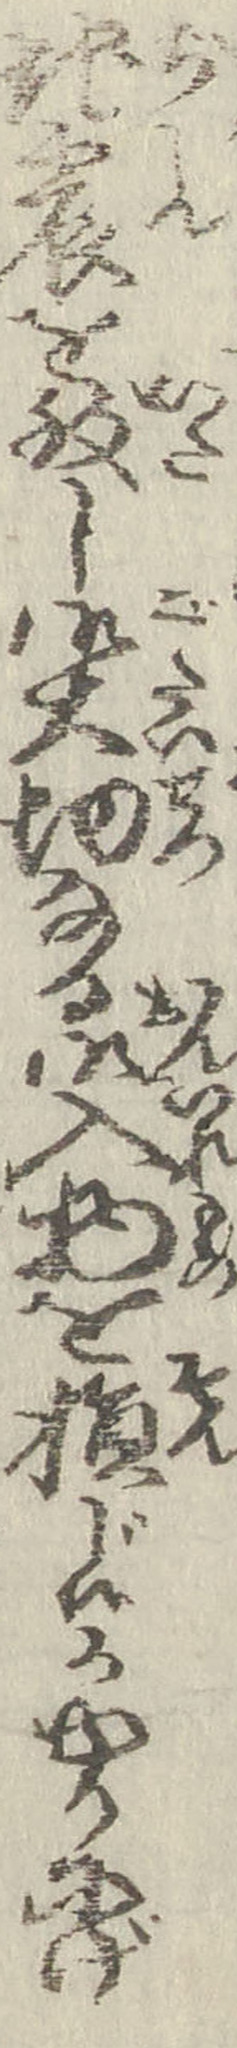地震を致し御大切なる御入物を損じ候而ゆりにげ
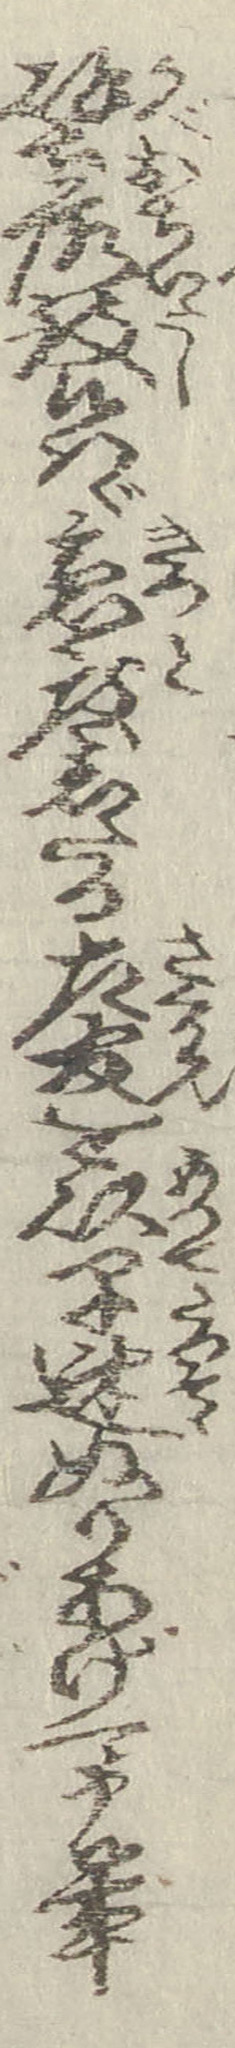壁落致候ハヾ急度したる左官を以早速ぬりあげ可申候事
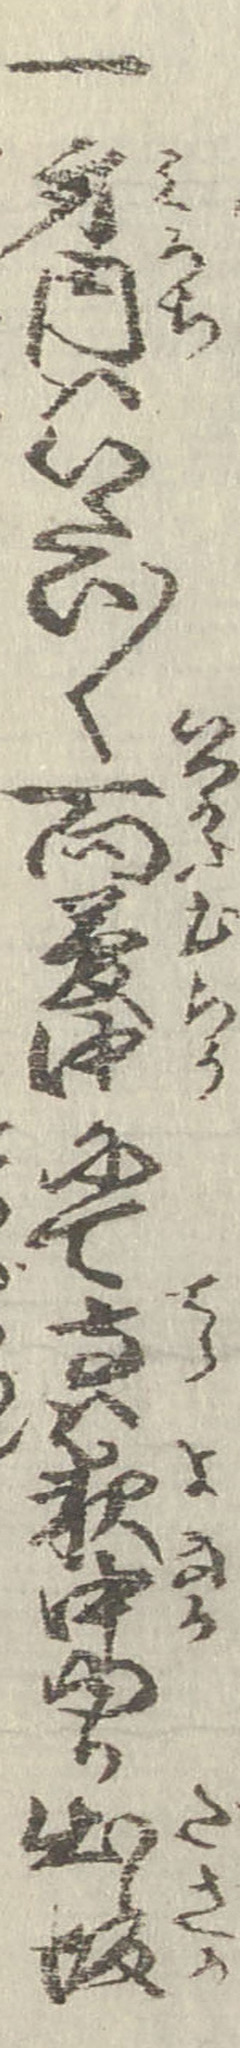一身内ハいたい〳〵一向夢中にて寺ハ夜中ゆり出坂
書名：地震方々ゆり状之事
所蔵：東京大学総合図書館 General Library in the University of Tokyo, JAPAN
